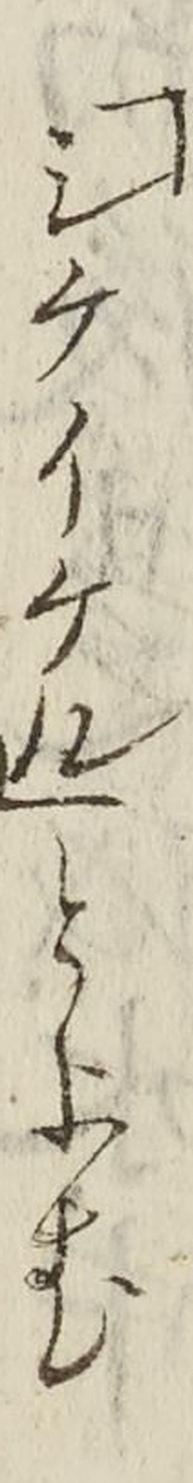「シケイケル」とよむ
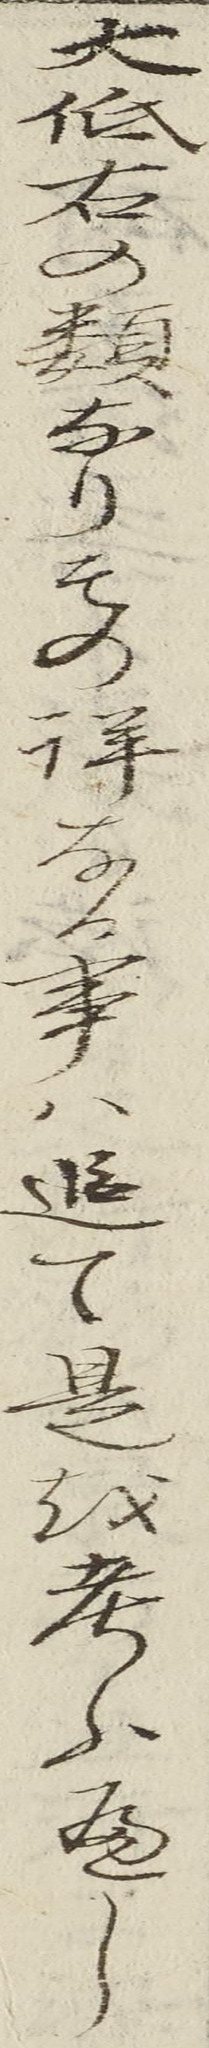大低右の類なりその詳なる事歯追て是を考ふべし
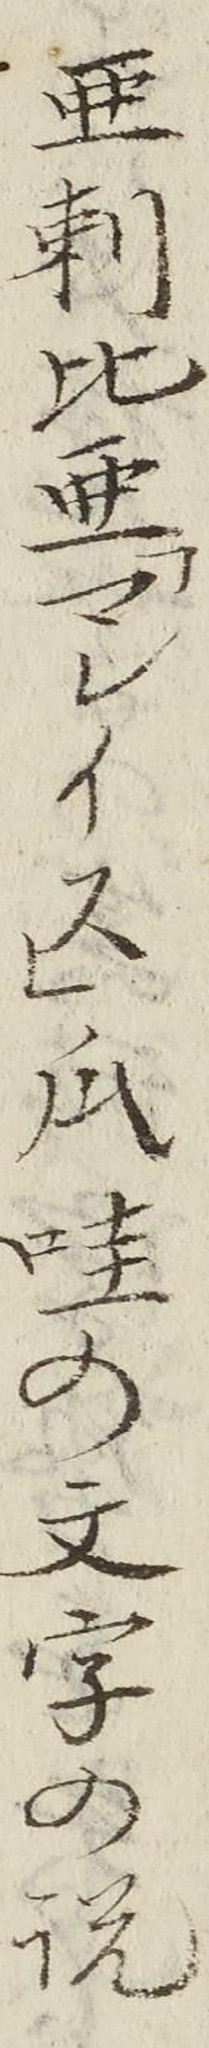亜刺比亜「マレイㇲ」瓜哇の文字の説
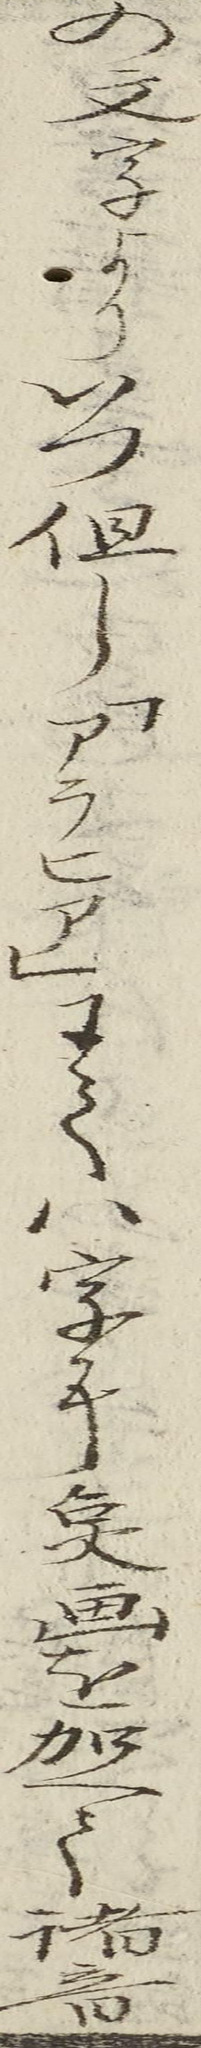の文字よりいつ但し「アラヒア」にてハ字に点画を加へて諸音
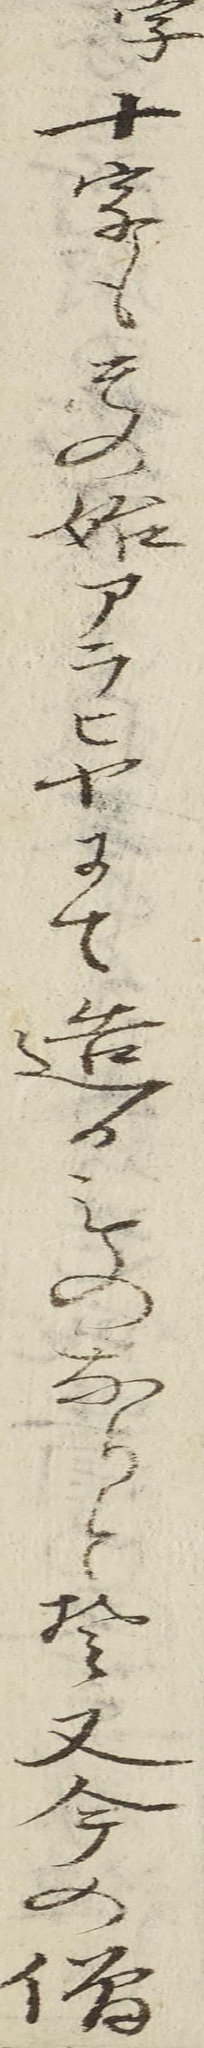字十字もその始アラヒヤにて造るものなりとそ又今の僧

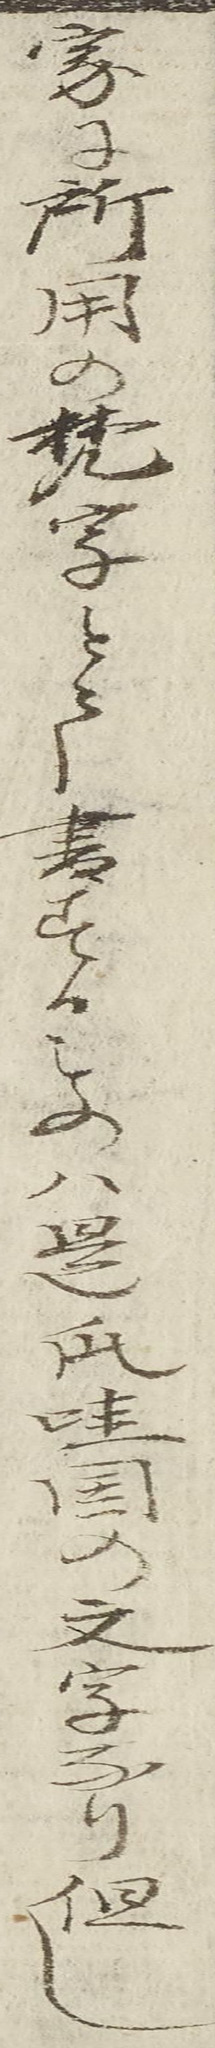家に所用の梵字とて書するものハ是瓜哇国の文字なり但し
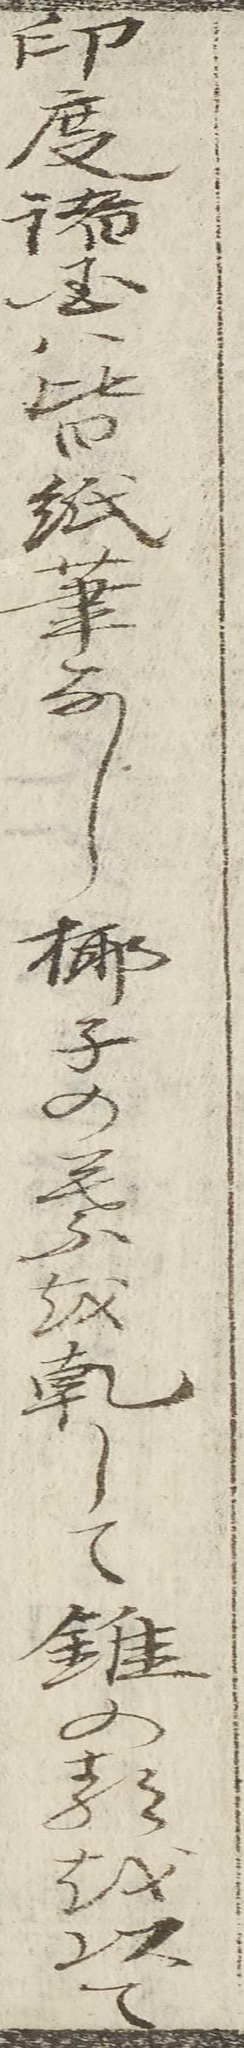印度諸国ハ皆紙筆なし椰子の葉を乹して錐の類を以て
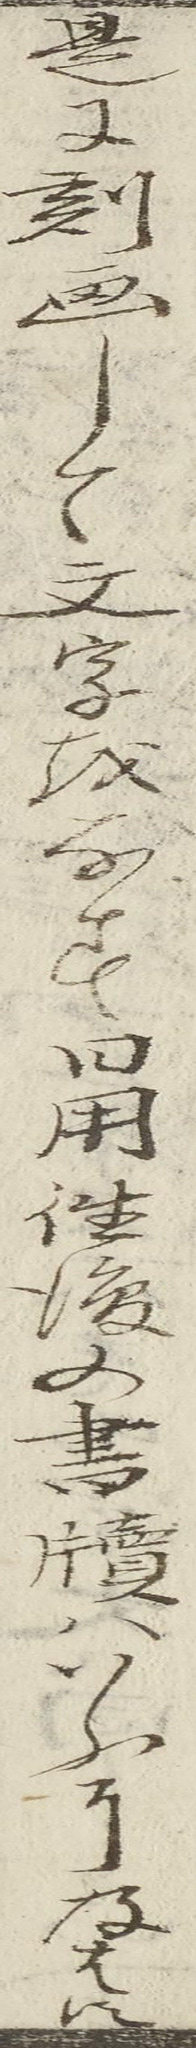是に刻画して文字をなす日用往復の書牘はいふに及はす
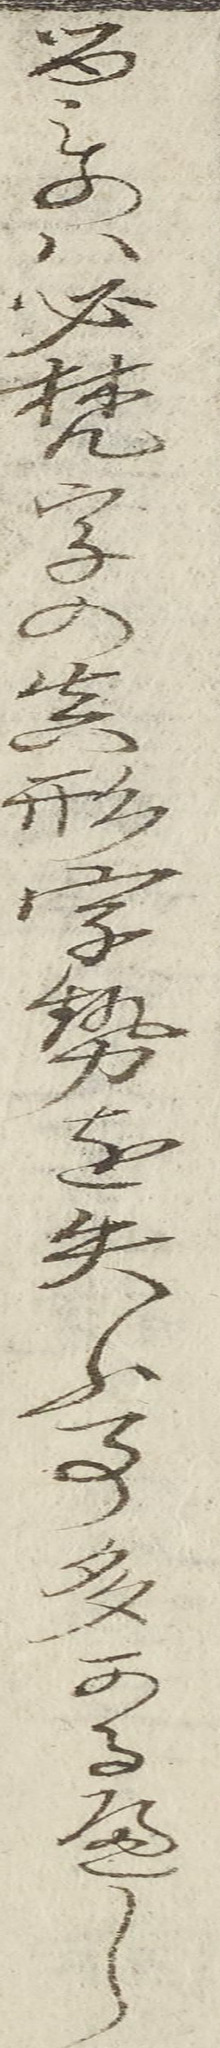るものは必梵字の真形字勢を失ふ事多かるへし
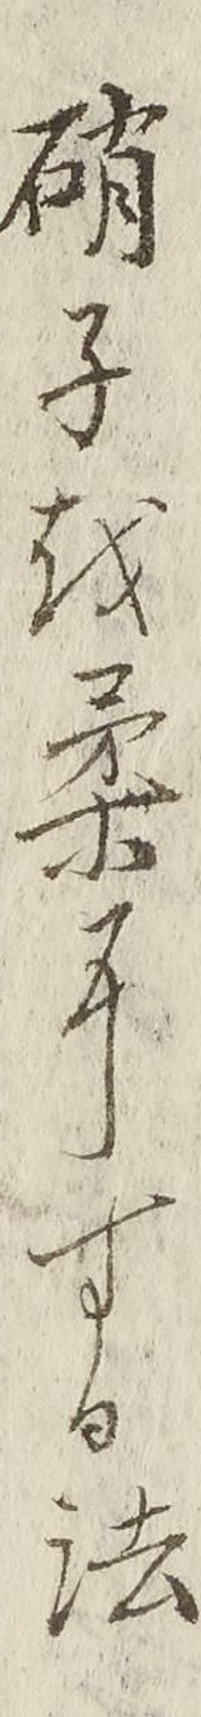硝子を柔にする法
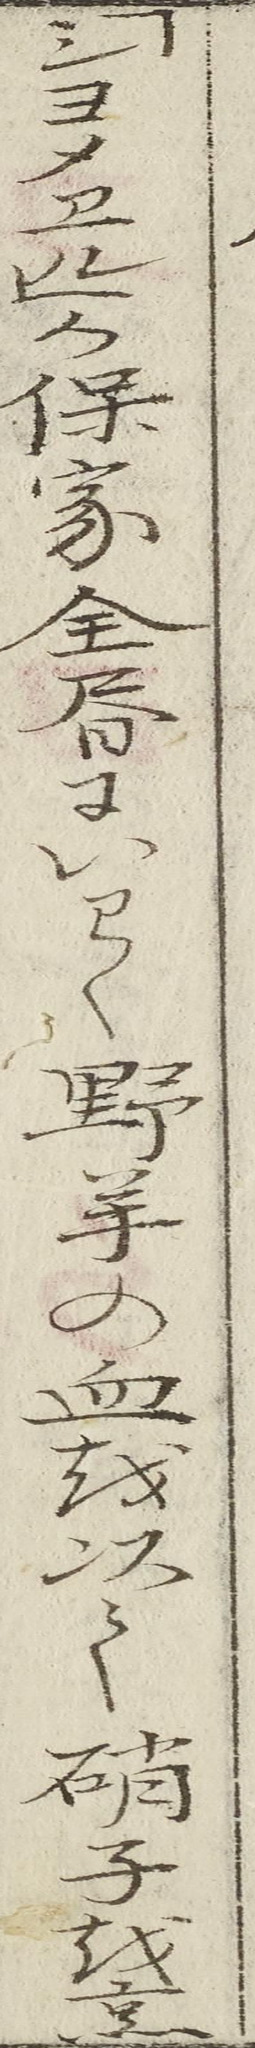「「シヨメヱル」か保家全書にいわく野羊の血を以て硝子を熹
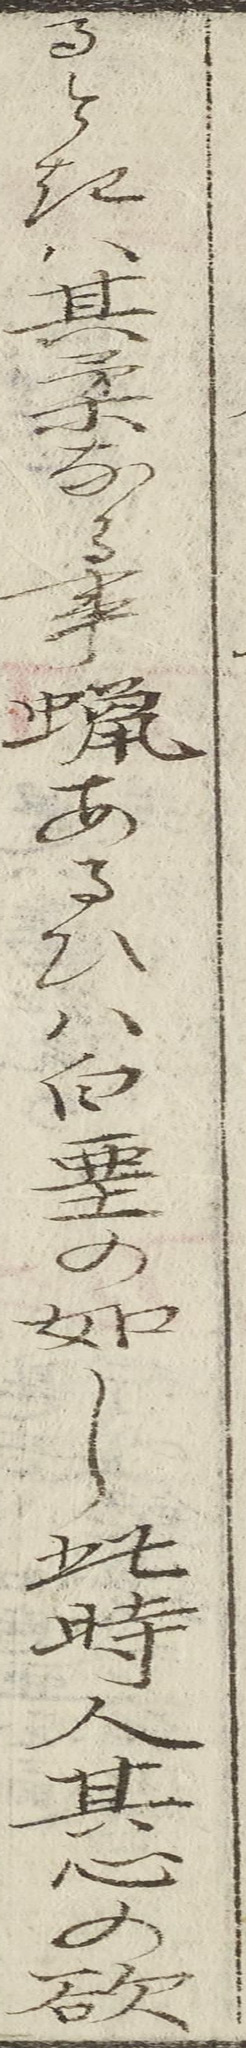るときハ其柔なる事蝋あるひハ白堊の如し此時人其心の欲
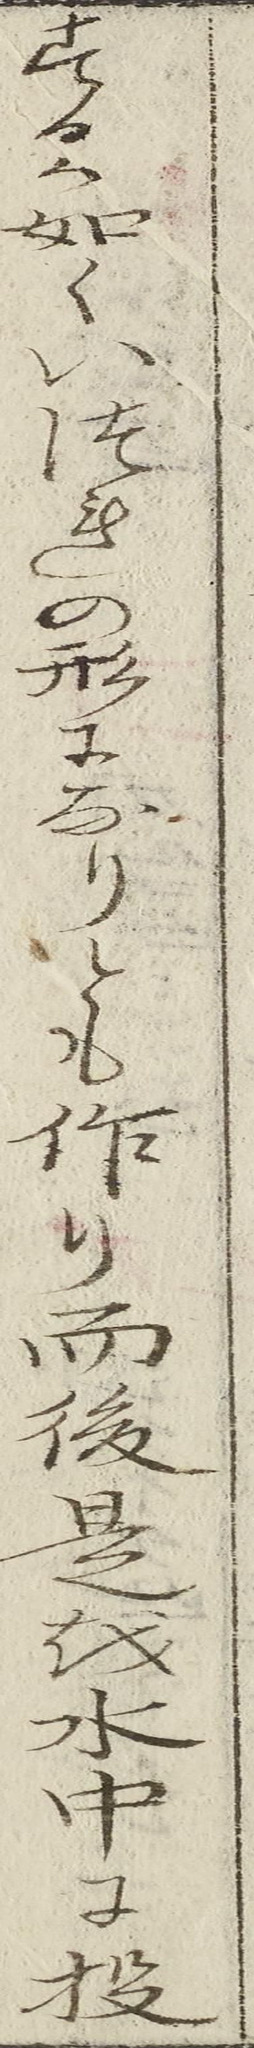するか如くいつれの形になりとも作り而後是を水中に投
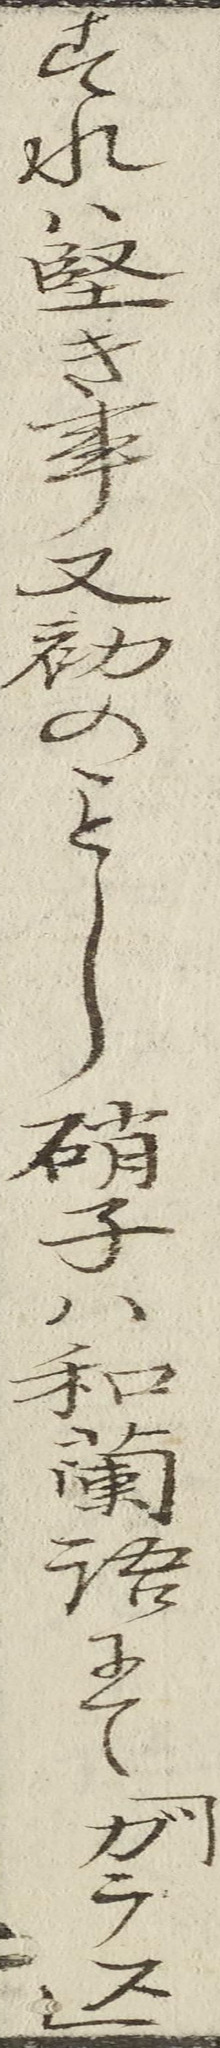すれハ堅き事又初のことし硝子ハ和蘭語にて「ガラス」
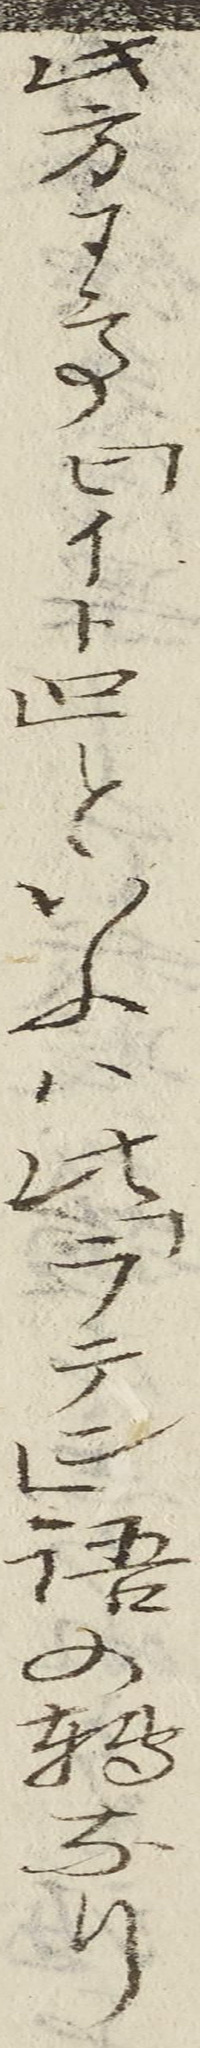此方にて「ヒイㇳロ」といふハ此の「ラテン」語の転なり
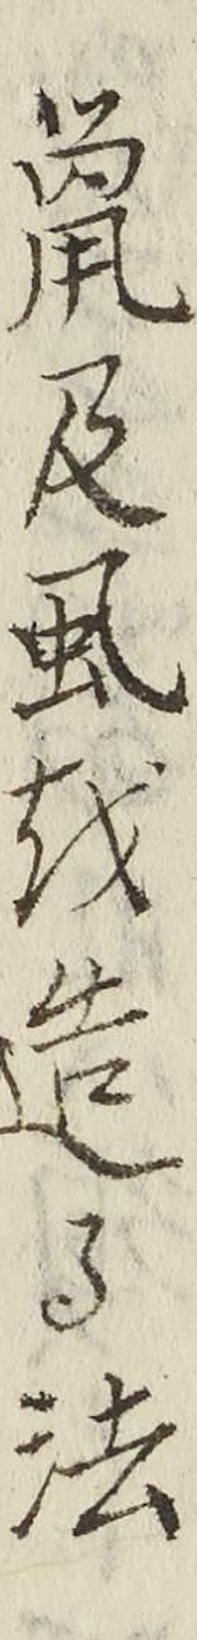鼠及虱を造る法
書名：西洋雜記　坤
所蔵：東京大学地震研究所図書室 Earthquake Research Institute Library, The University of Tokyo, JAPAN
